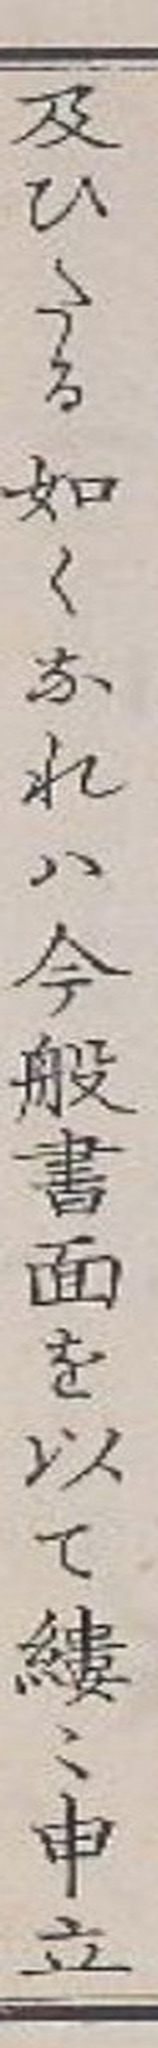及ひたる如くなれは今般書面を以て縷々申立
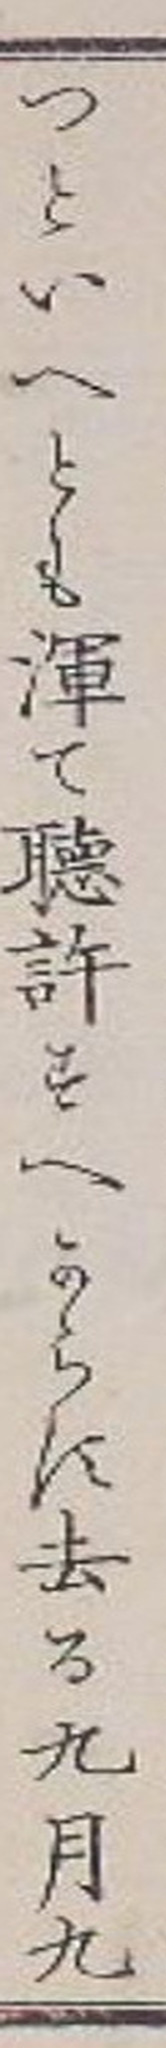つといへとも渾て聴許すへからす去る九月九
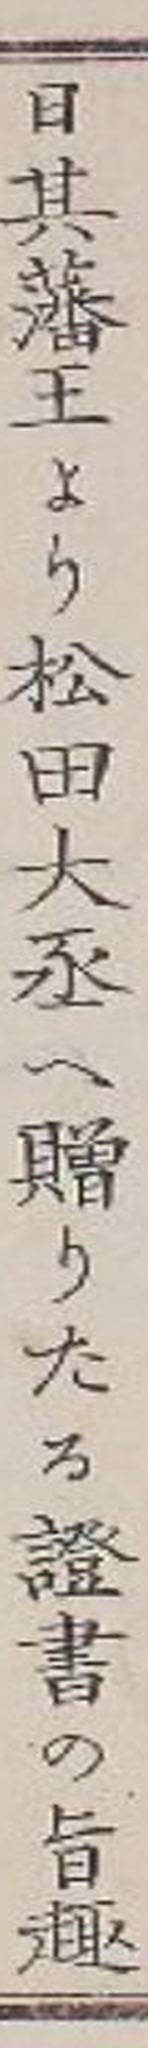日其藩王より松田大丞へ贈りたる証書の旨趣
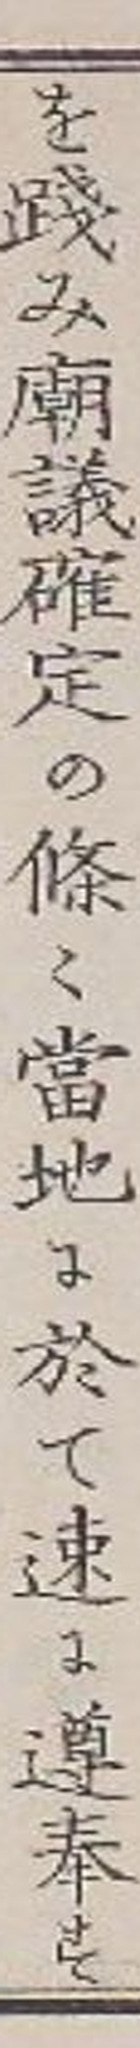を践み廟議確定の条々当地に於て速に遵奉す
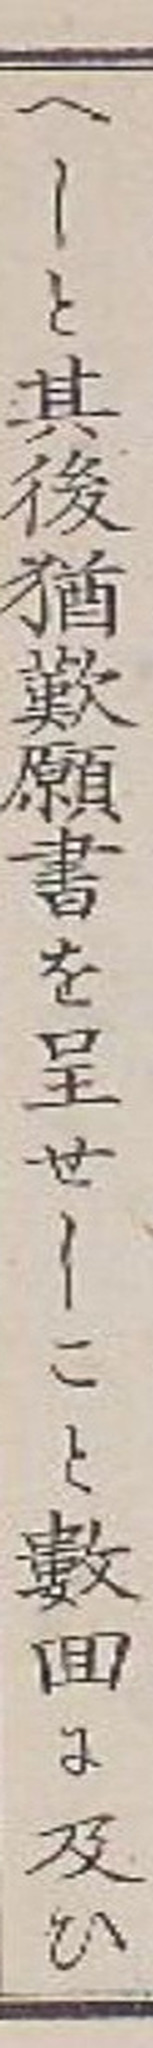へしと其後猶歎願書を呈せしこと数回に及ひ
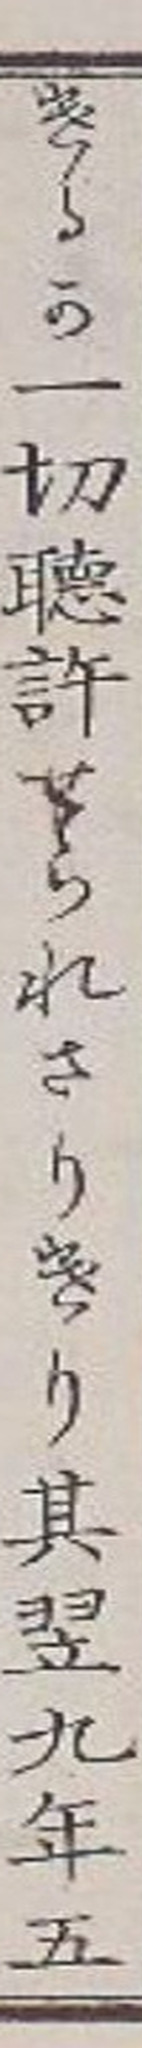けるか一切聴許せられさりけり其翌九年五
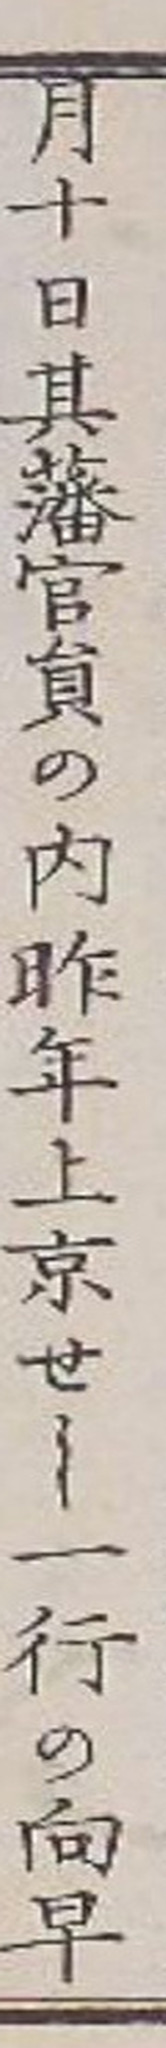月十日其藩官員の内昨年上京せし一行の向早
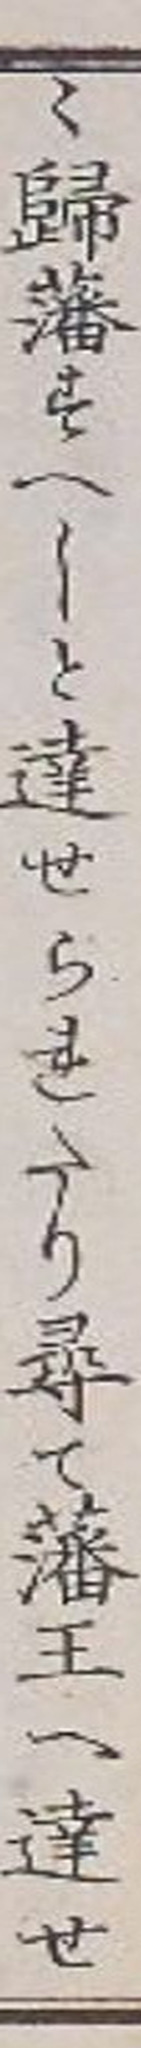々帰藩すへしと達せられたり尋て藩王へ達せ
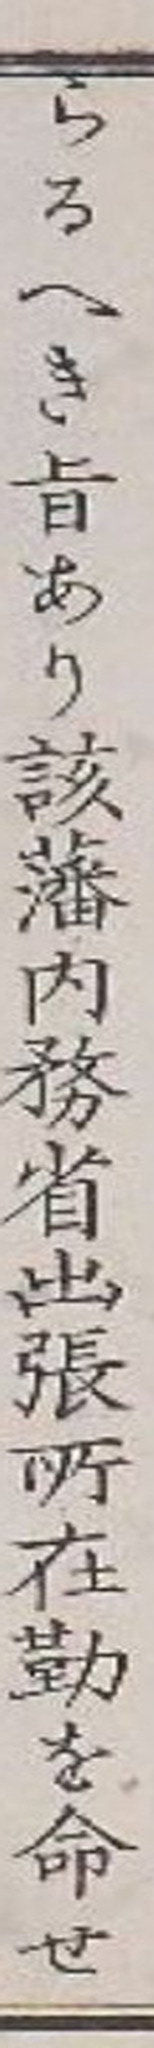らるへき旨あり該藩内務省出張所在勤を命せ
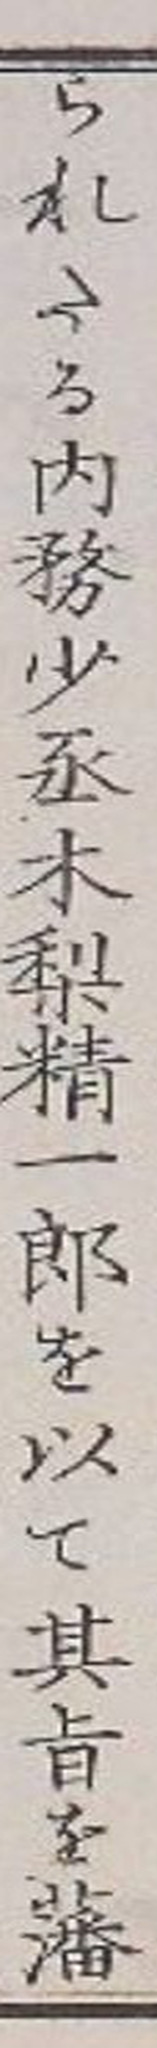られたる内務少丞木梨精一郎を以て其旨を藩
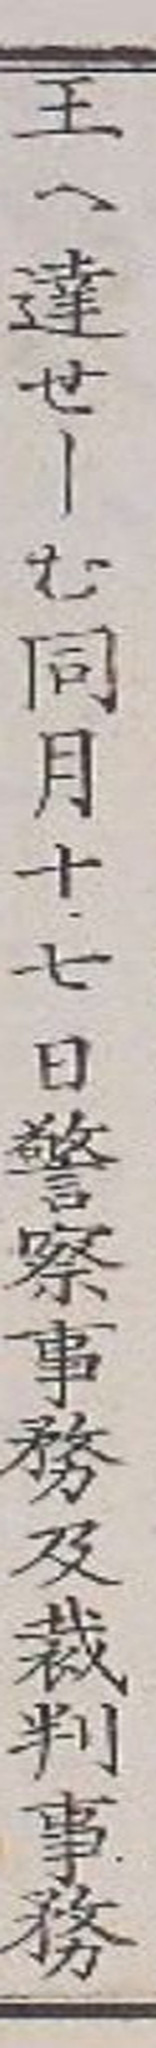王へ達せしむ同月十七日警察事務及裁判事務
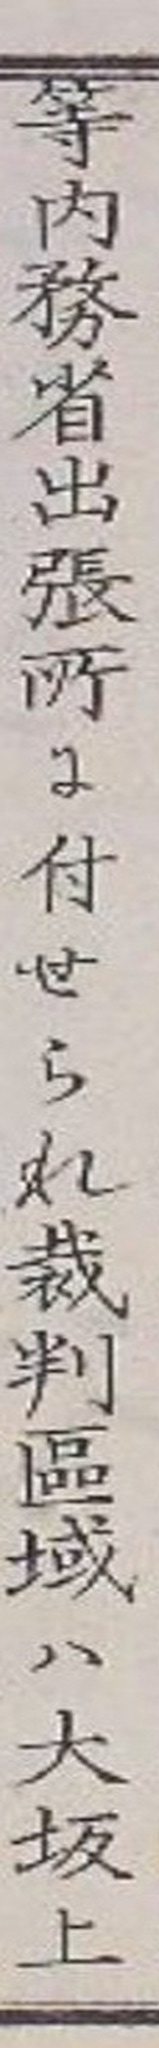等内務省出張所に付せられ裁判区域は大阪上
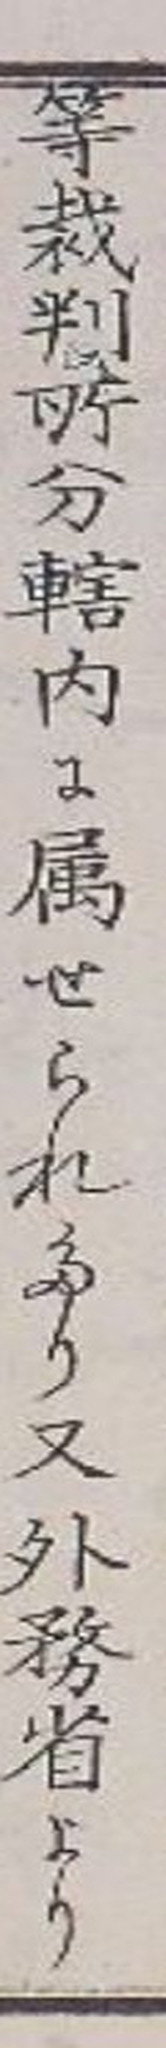等裁判所分轄内に属せられたり又外務省より
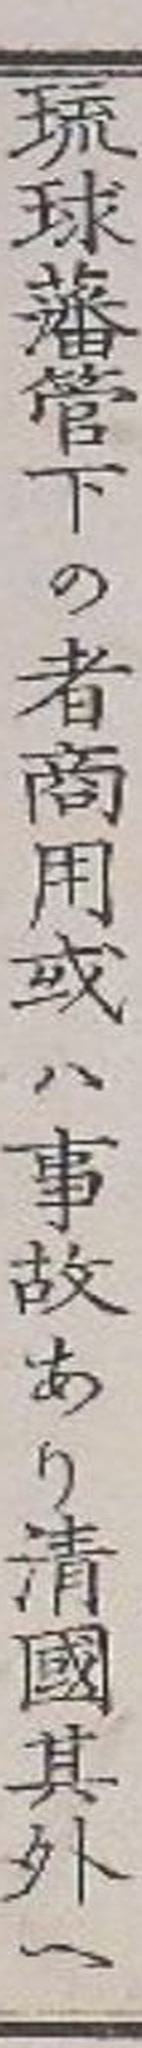琉球藩管下の者商用或は事故あり清国其外へ
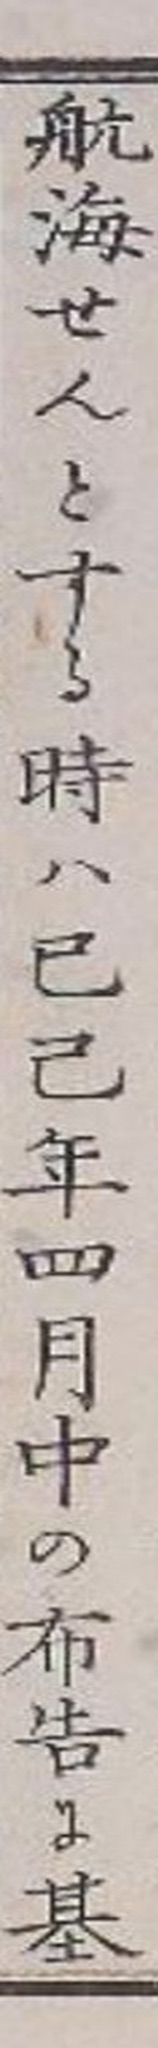航海せんとする時は巳己年四月中の布告に基

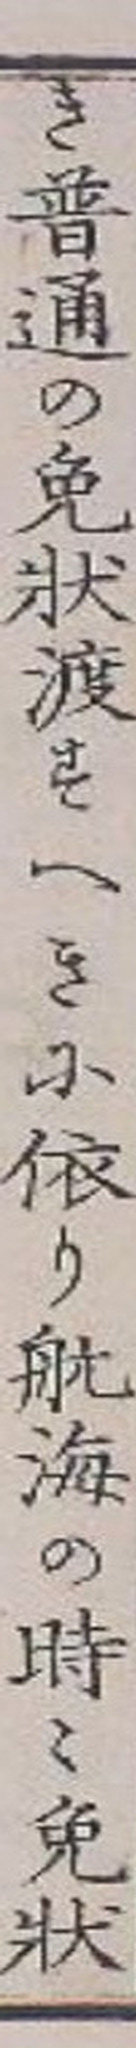き普通の免状渡すへきに依り航海の時々免状
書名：南島紀事 下
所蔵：University of the Ryukyus Library
